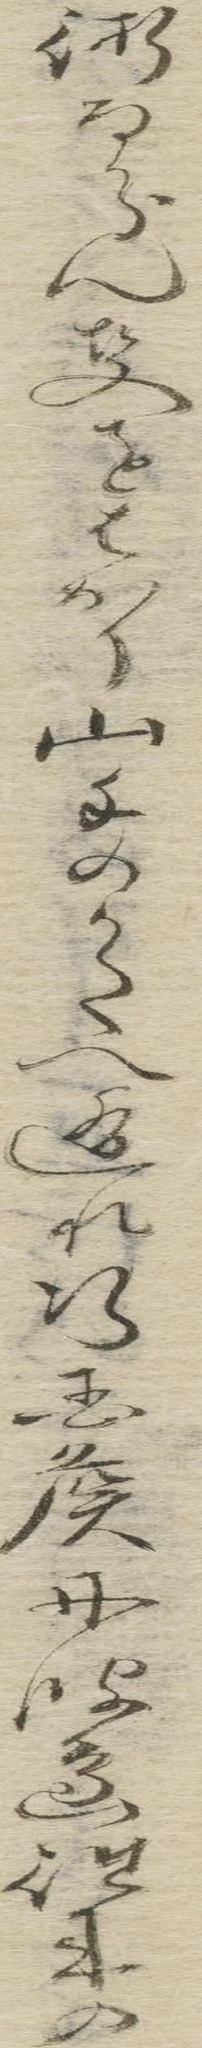術なからん変をはかり山手のかたへ遁れ行国矦丹波島往来の
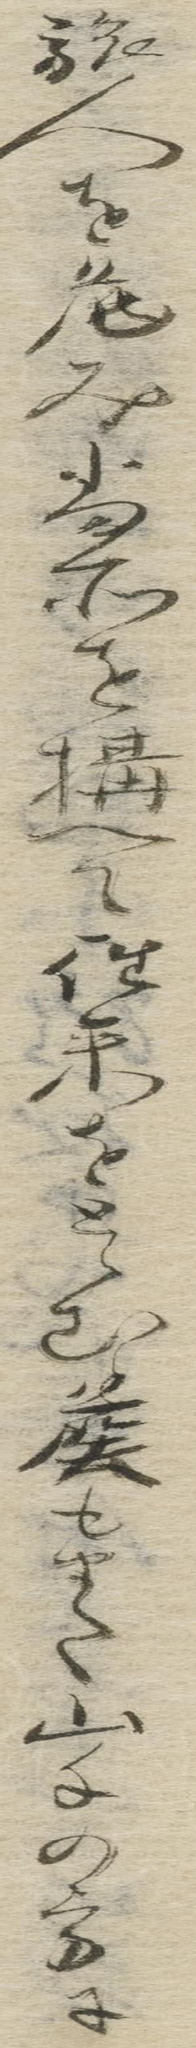旅人を危み当所を構へて往来をとむ矦もまた山手の方に
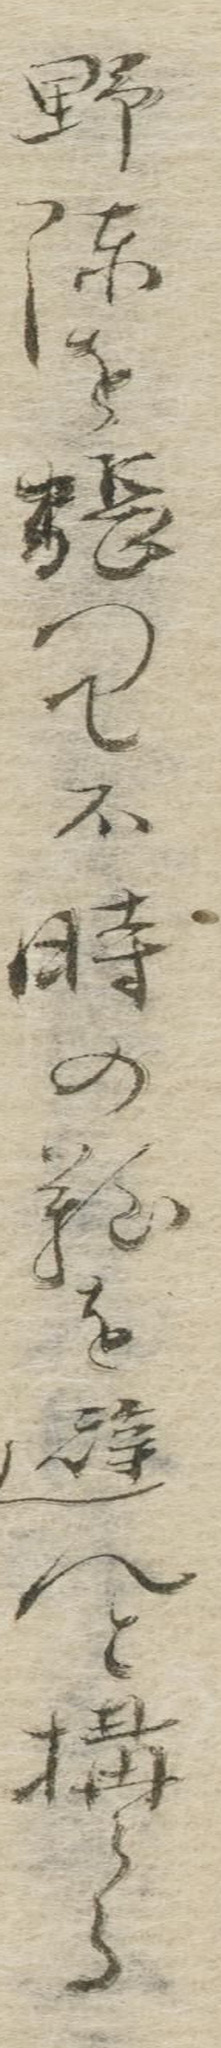野陣を張つて不時の難を避んと構うる
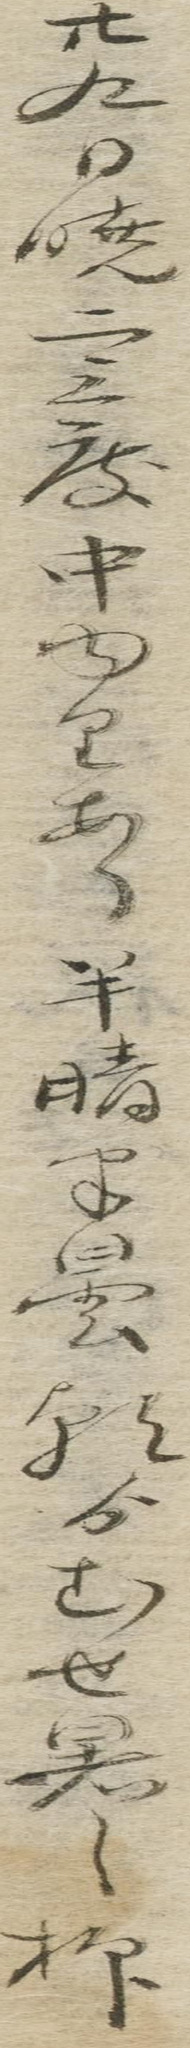廿九日暁二三度中ゆりあり半晴半曇朝ゟむせ暑し抑
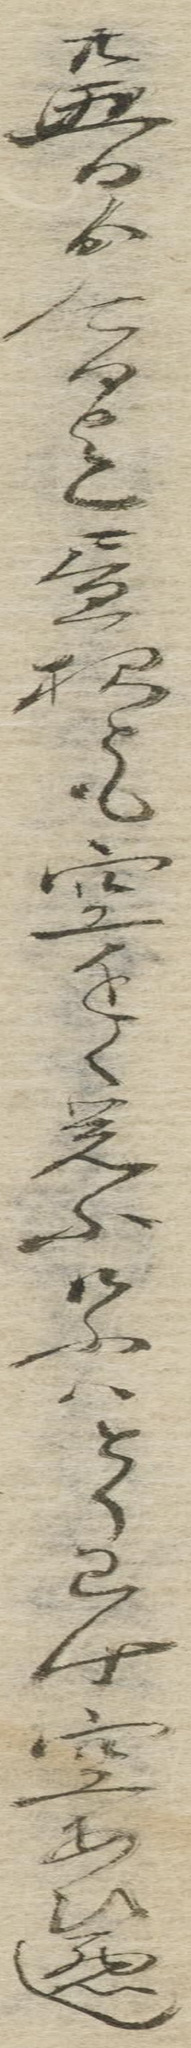廿五日ゟ今日迄昼夜とも空近く覚ふけふハとりわけ空あひ悪し
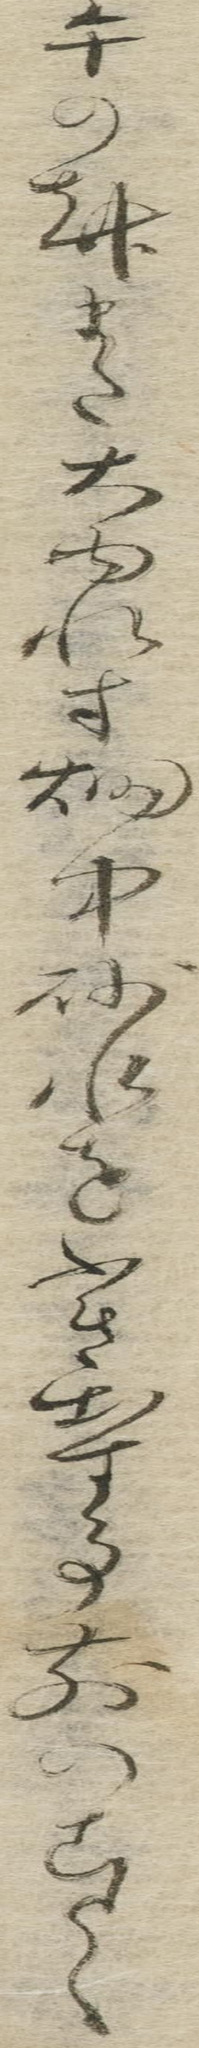午の刻また大ゆれす畑中砂水をふき出す事前のことし
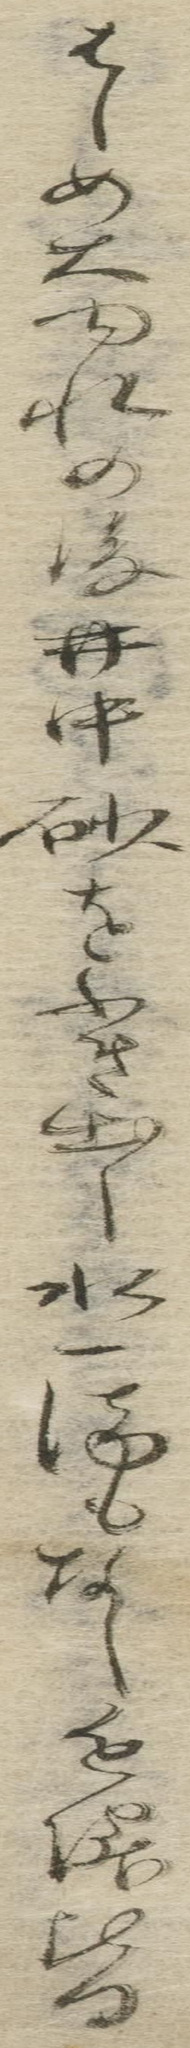はしめ大ゆれの後井中砂をふき出し水一滴もなし近隣皆

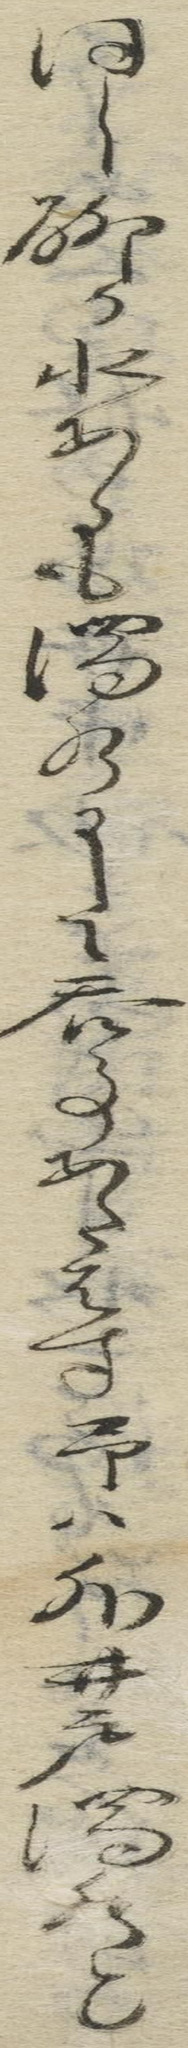ほし聊か水あるも濁水にて呑事あたはす予ハ外井戸濁水と
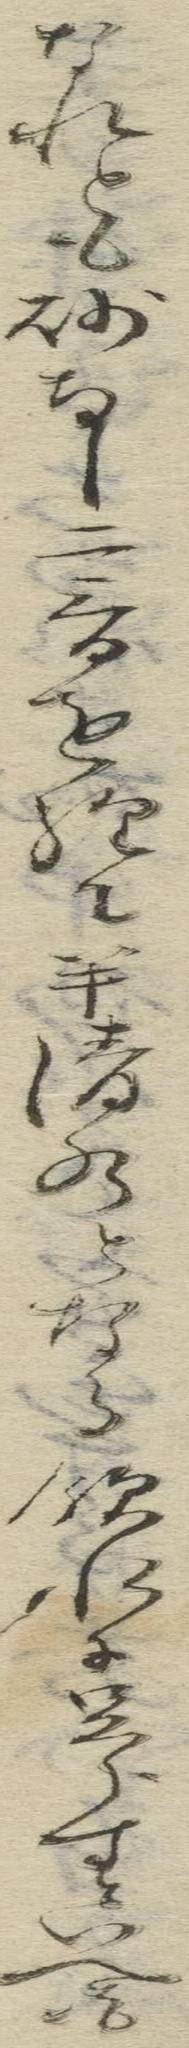なれとも砂なし二三日を経て半清水となる飲水に足らすといへとも
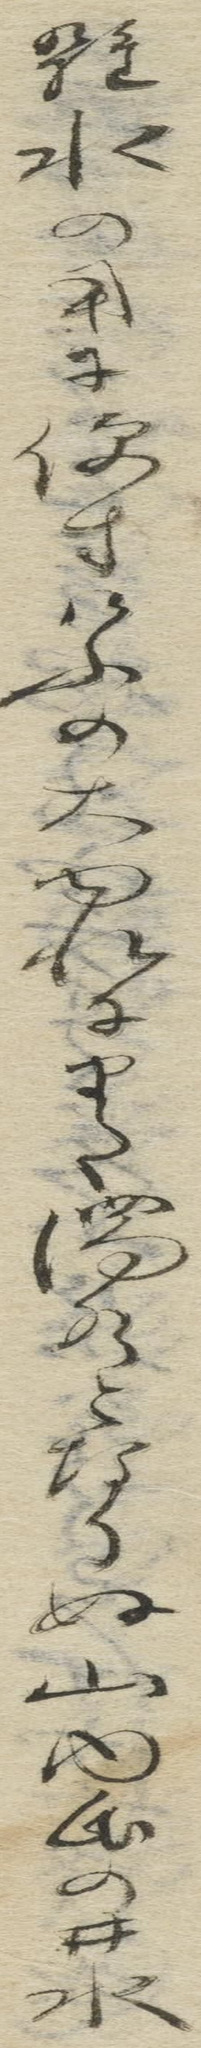雑水の用に便すけふの大ゆれにまた濁水となりぬ山内氏の井水
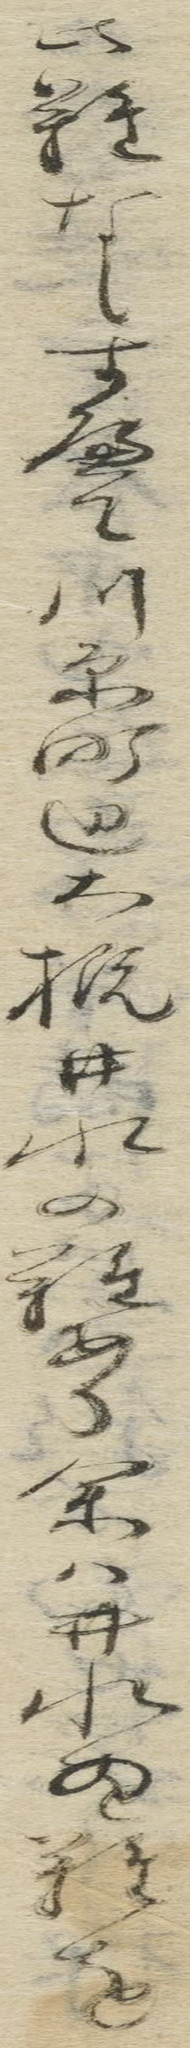此難なしすへて河原町辺大概井水の難あり余ハ井水の難を
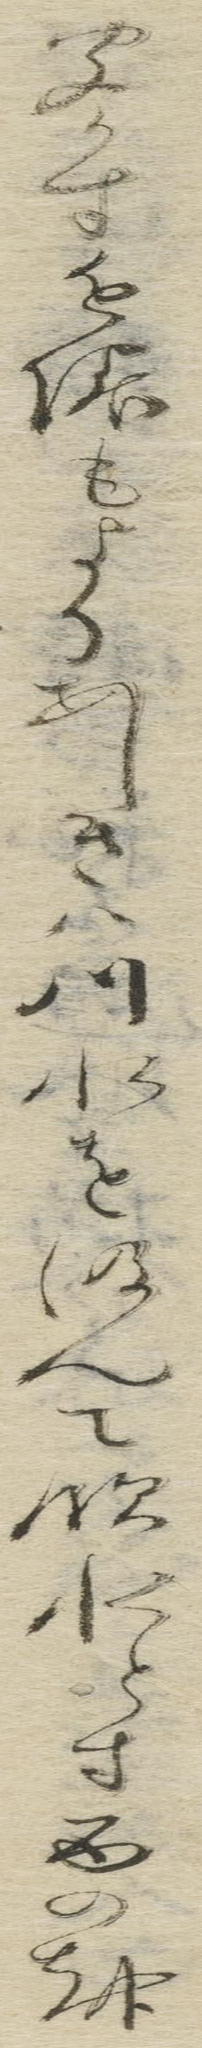聞かす近隣もよりあしきハ川水を汲んで飲水とす酉の刻
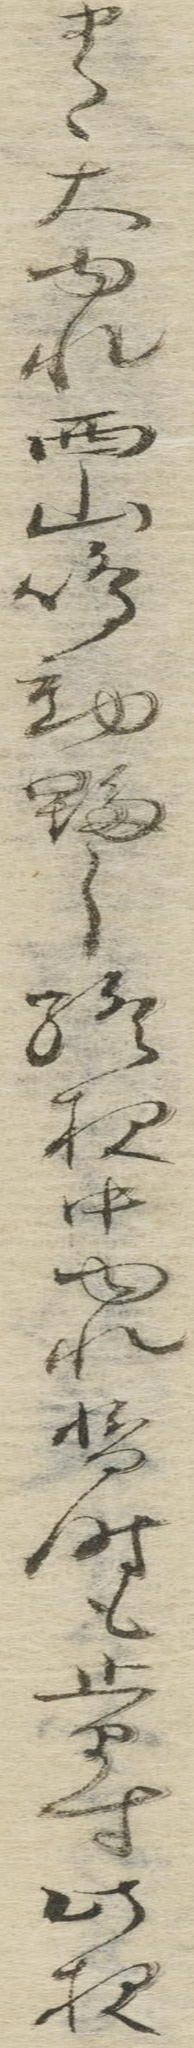また大ゆれ西山鳴動夥し終夜中ゆれ暫時も止ます此夜
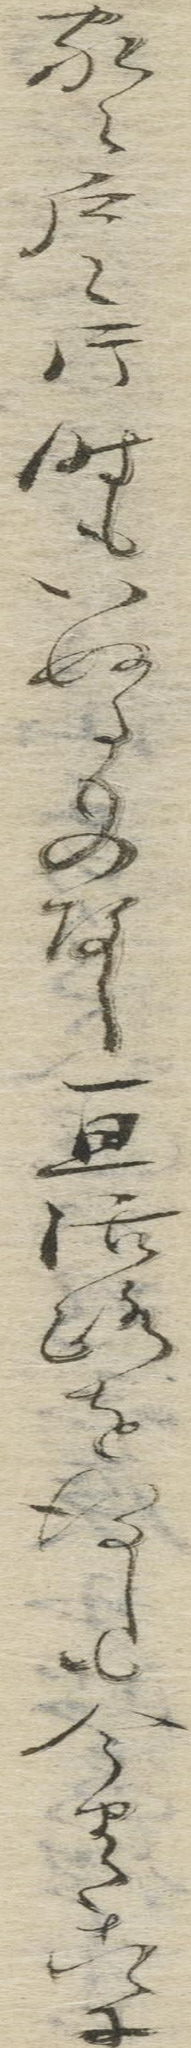家々戸々片時もいぬるものなし一旦活路を得しも今またこゝ
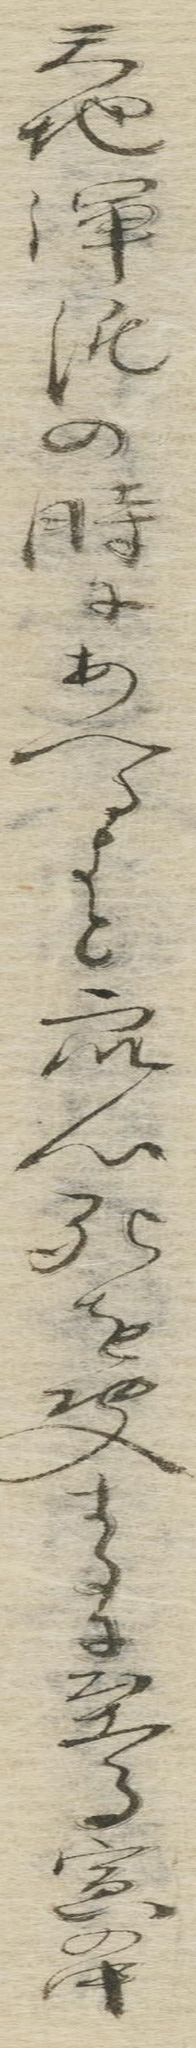天地渾沌の時にあへるにと衆人死を決するに至る寅の中
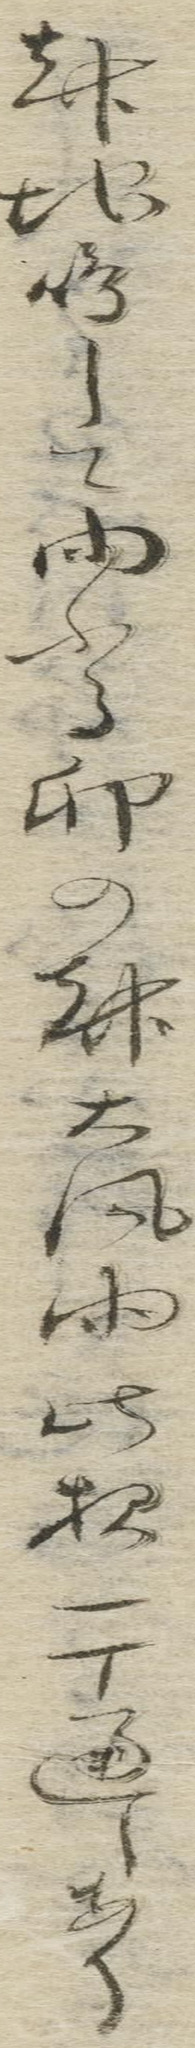刻地鳴して雨ふる卯の刻大風雨此夜一丁通しあり
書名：弘化丁未天變日記
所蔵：東京大学地震研究所図書室 Earthquake Research Institute Library, The University of Tokyo, JAPAN
